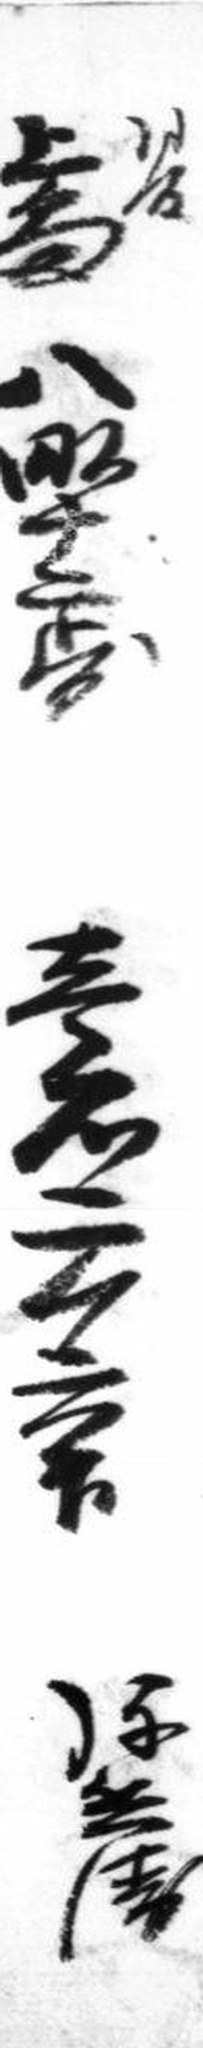上畠八畝十二歩壱石二斗六升孫兵衛

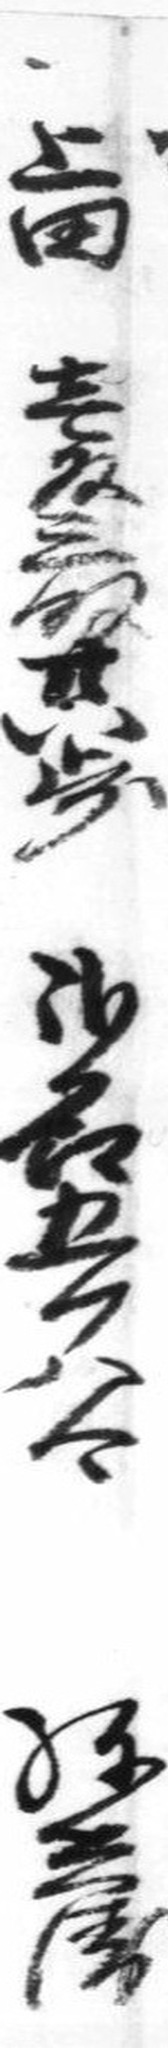上田壱反三畝廿八歩弐石五斗八合孫兵衛
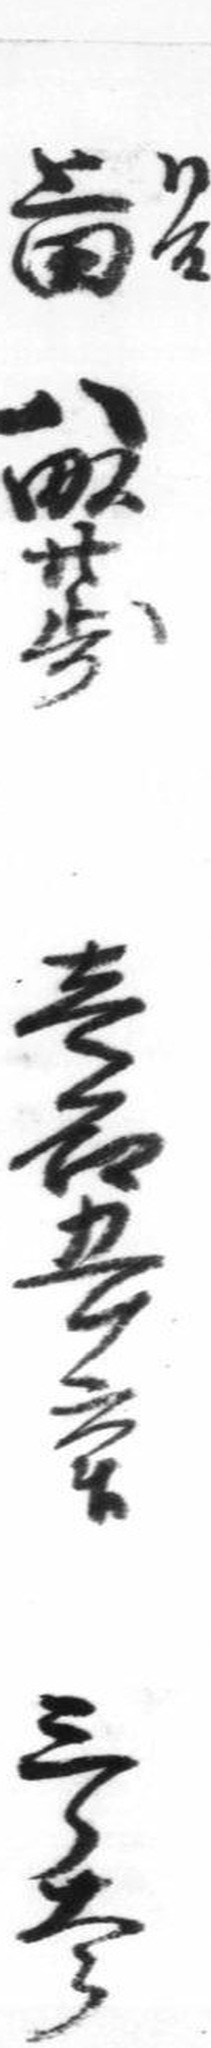上田八畝廿歩壱石五斗六升三郎太郎
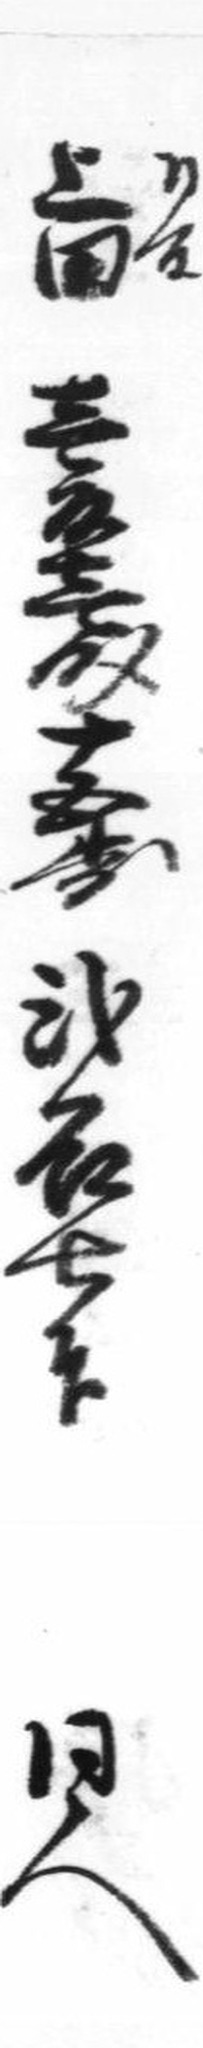上田壱反壱畝十五歩弐石七升同人
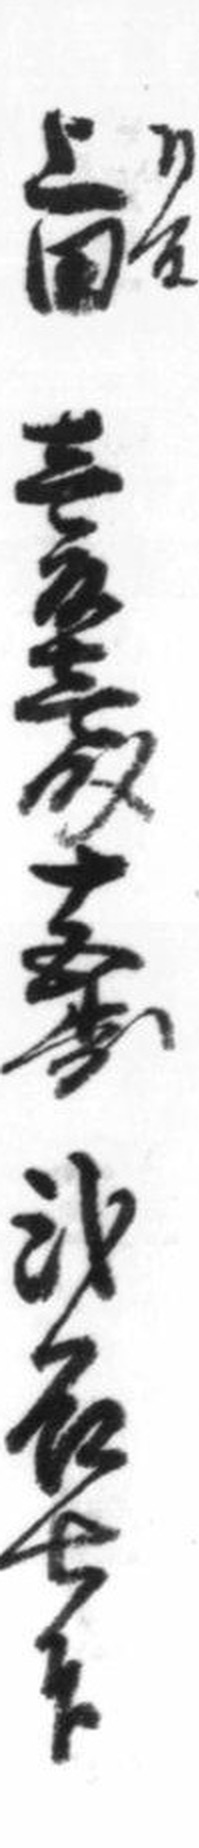上田壱反壱畝十五歩弐石七升同人
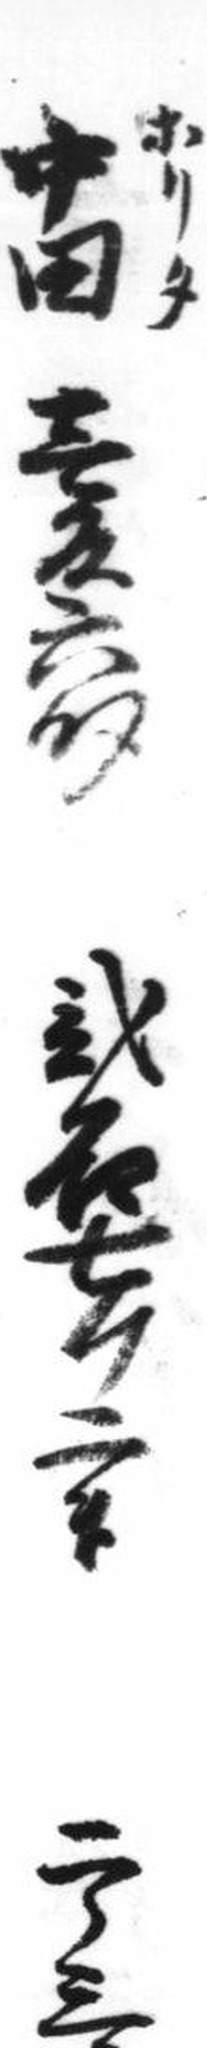中田壱反六畝弐石七斗二升二郎三郎
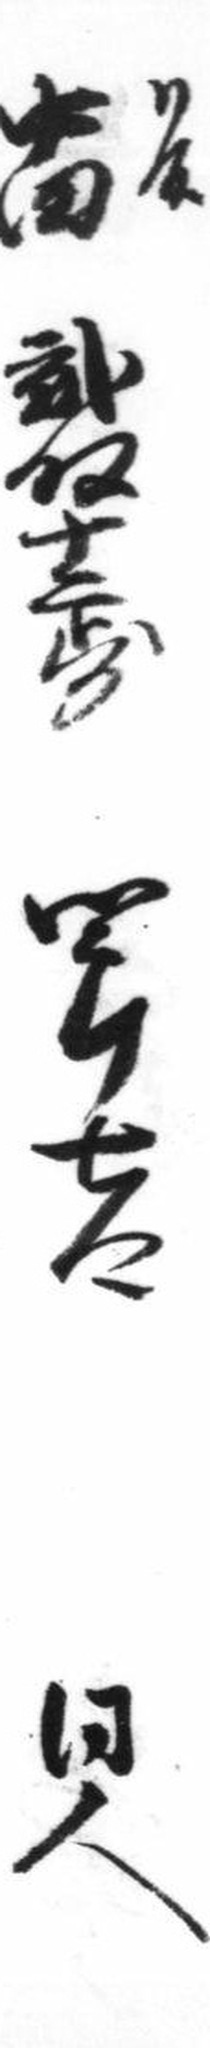中田弐畝十二歩四斗七合同人
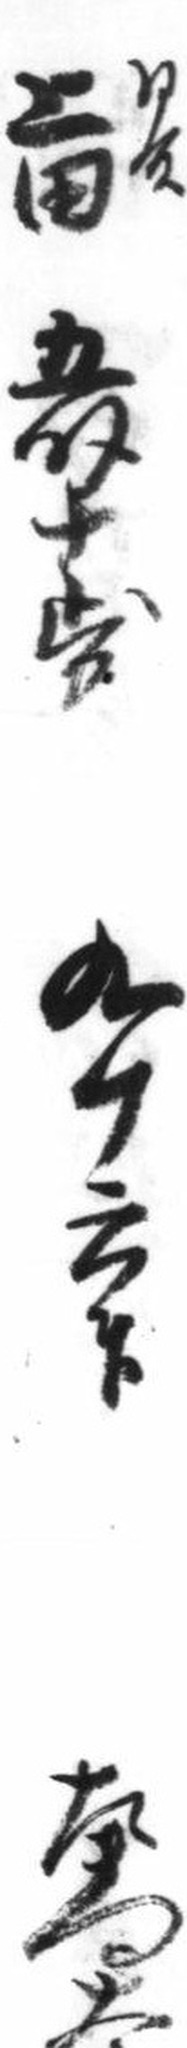上田五畝十歩九斗六升左衛門太郎
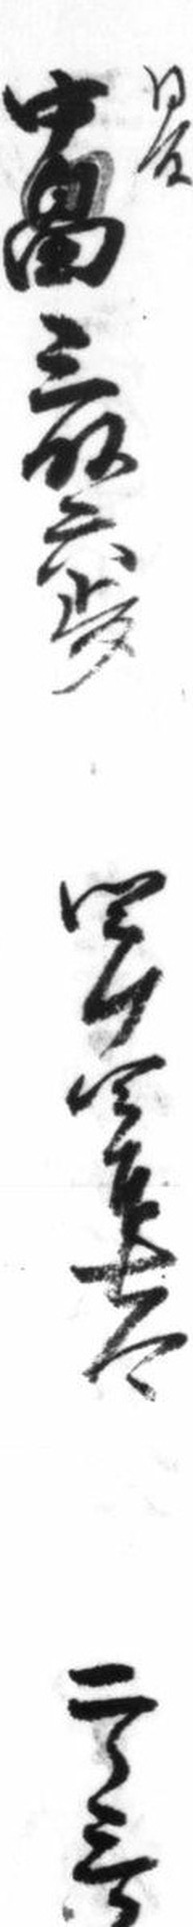中畠三畝六歩四斗四升七合二郎三郎
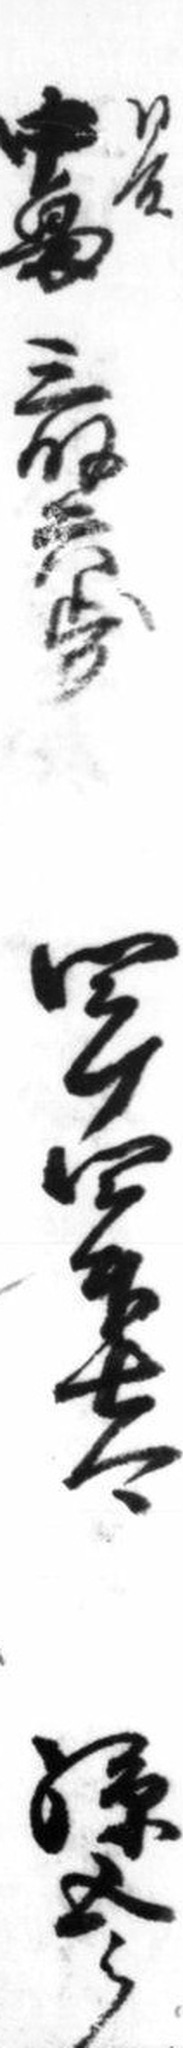中畠三畝六歩四斗四升七合孫五郎

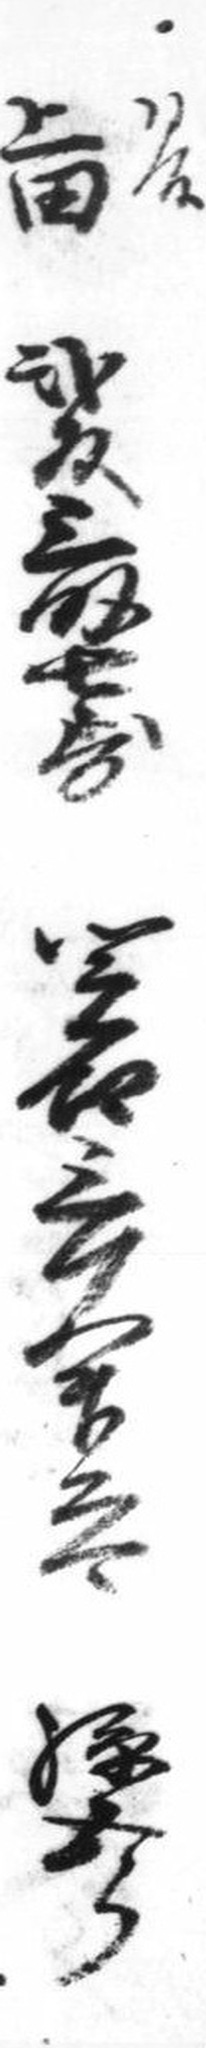上田弐反三畝七歩四石三斗八升二合孫五郎
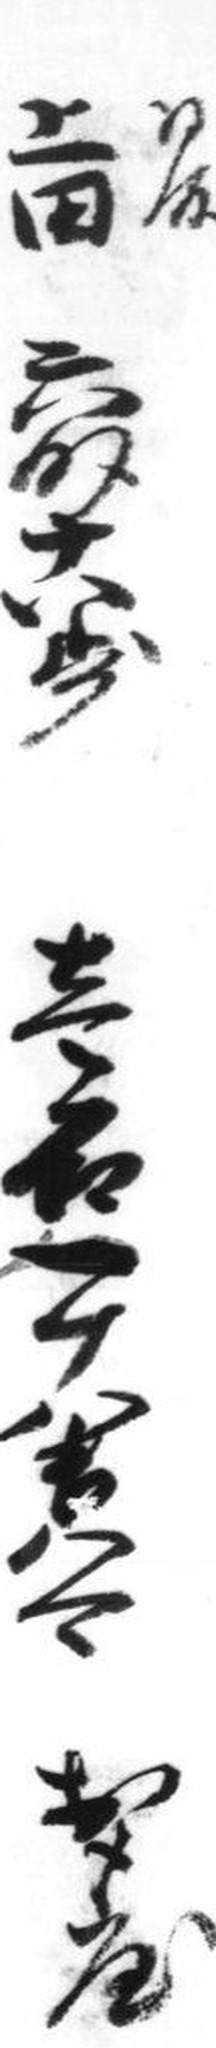上田六畝十八歩壱石一斗八升八合出〆屋
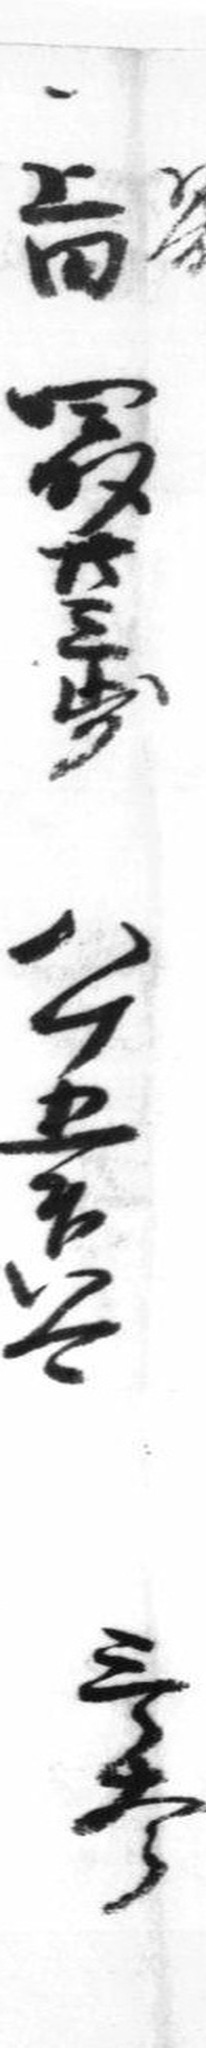上田四畝廿三歩八斗五升八合三郎太郎
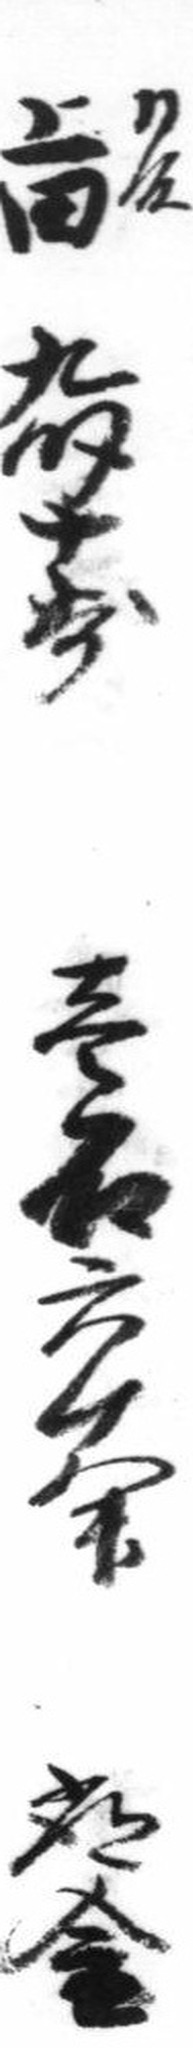上田九畝十歩壱石六斗八升常念
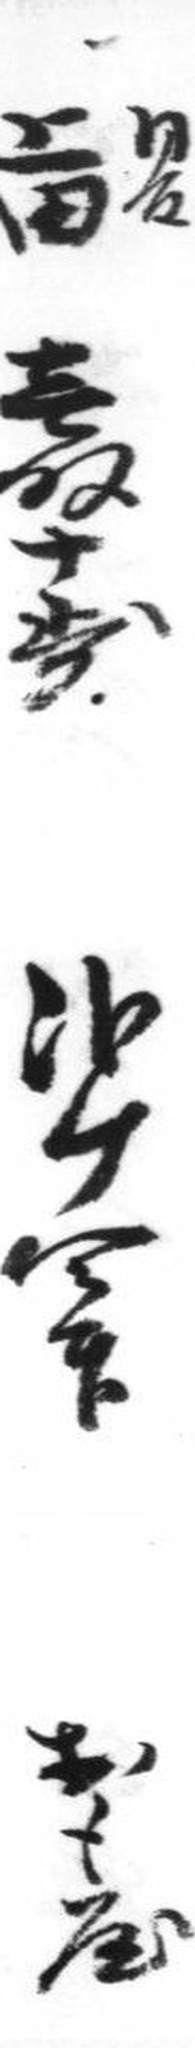上田壱畝十歩弐斗四升出〆屋
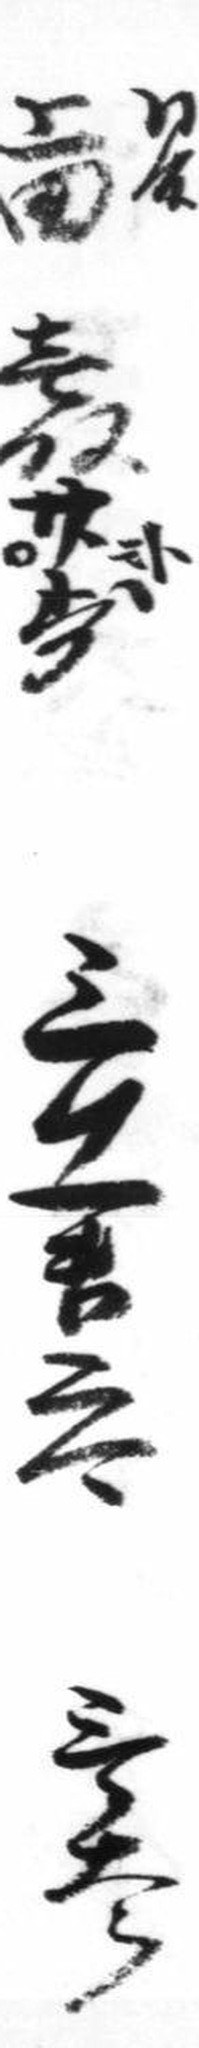上田壱畝廿弐歩三斗一升二合三郎太郎
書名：越前国大野郡今井村御検地帳
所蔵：福井県文書館 Fukui Prefectural Archives
